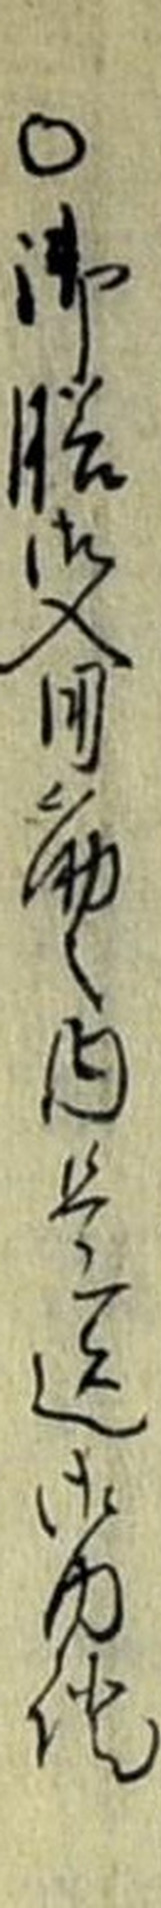〇御膳御入用筋之内是迄御内証
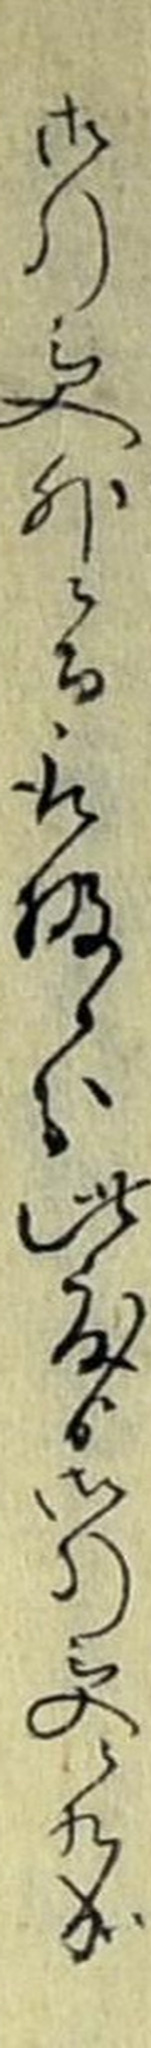御引受外ニ而取扱候分此度ゟ御引受ニ相成
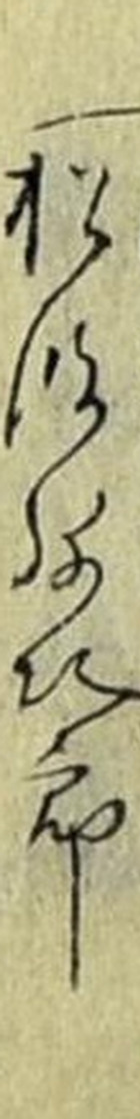松波弥次郎
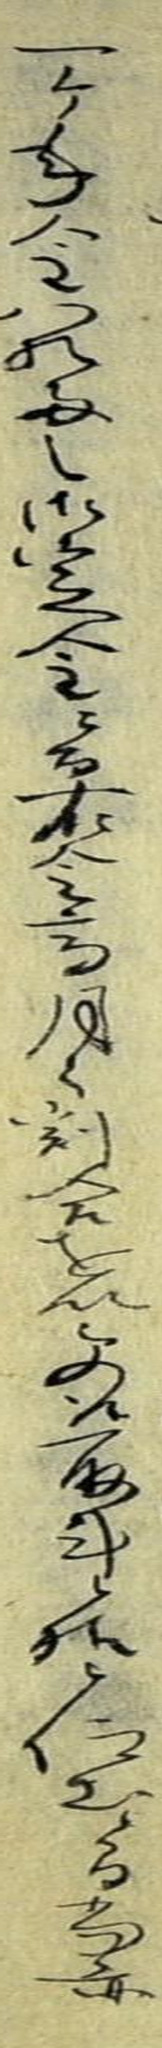一ケ年金八拾両之御定金ニ而右金高月々割合を以受取取計候様被仰出候間尚亦
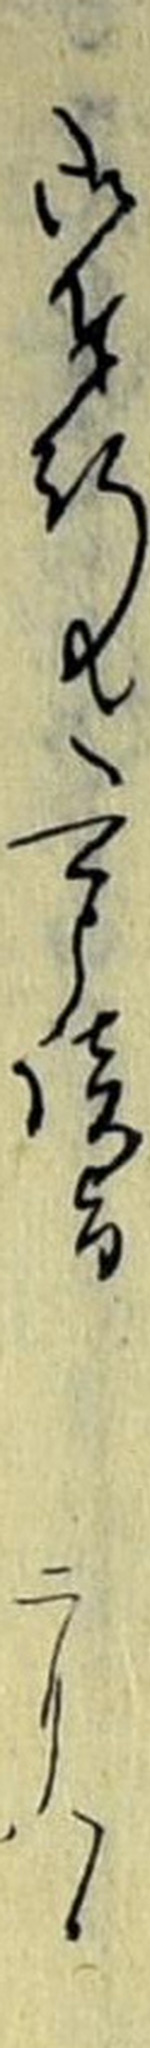御奉行共へ可申談旨二月八日

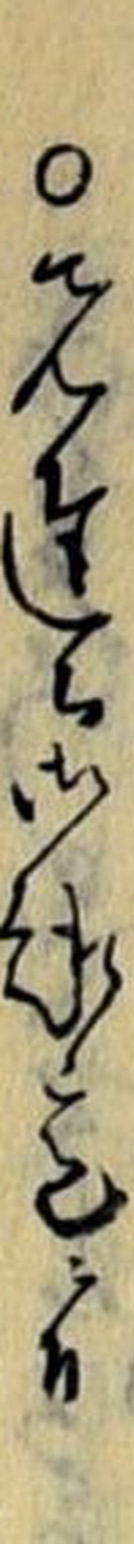〇先達而御趣意ニ付
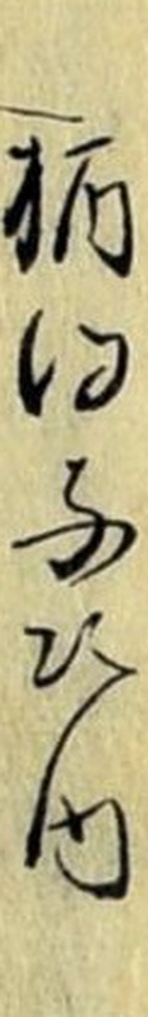柄田与次内
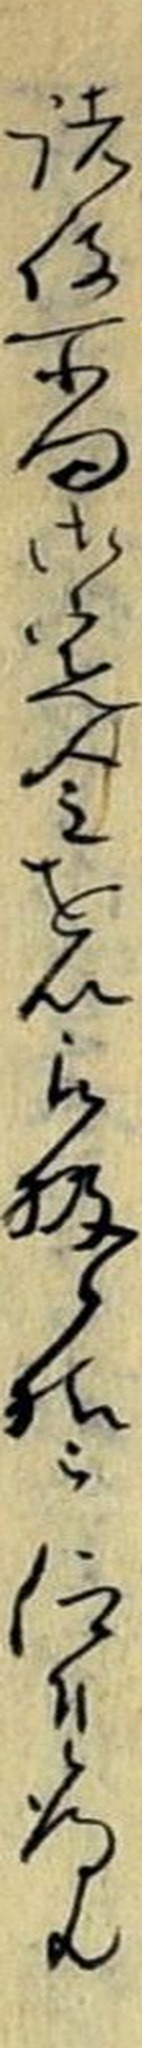諸役所向御定金を以取扱候様被仰付候得共
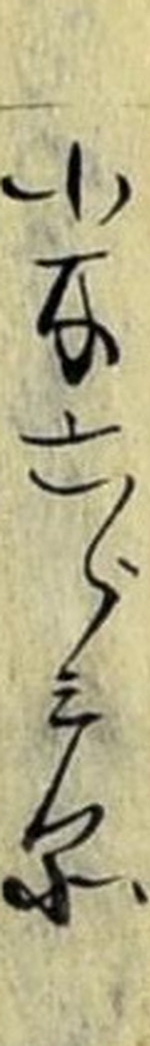小木六郎兵衛
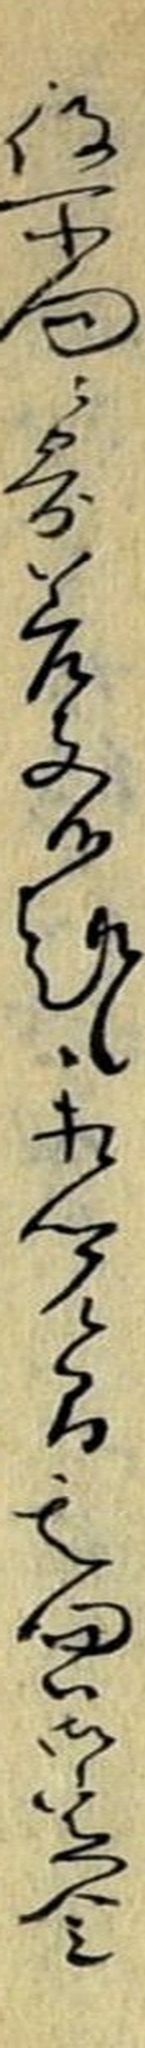役所向ニ寄差支候趣も相聞候間其向ハ御定金
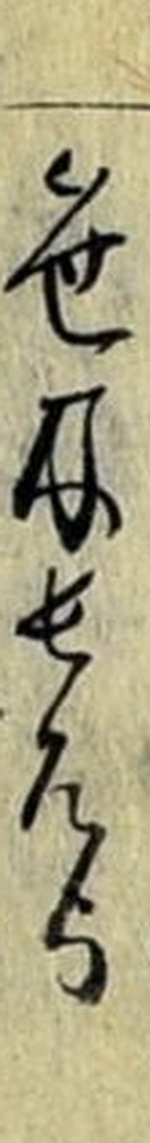笹木長左衛門
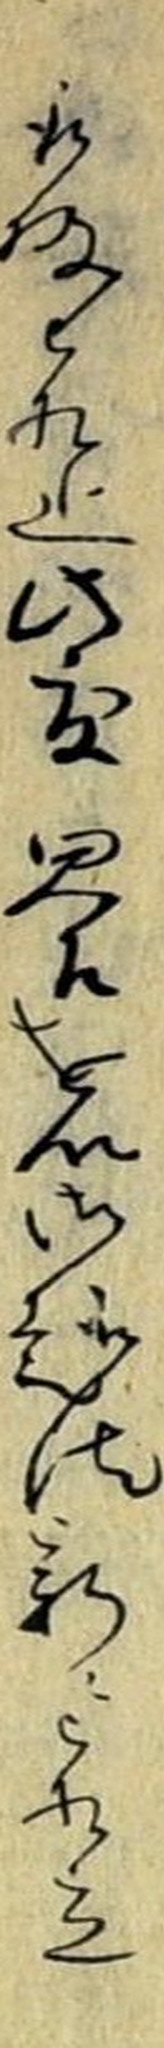取扱被相止此度思召を以御趣法新ニ被相立
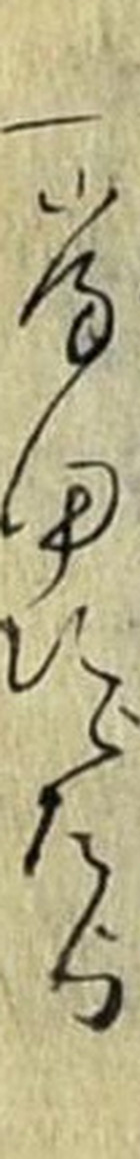岸田次郎左衛門
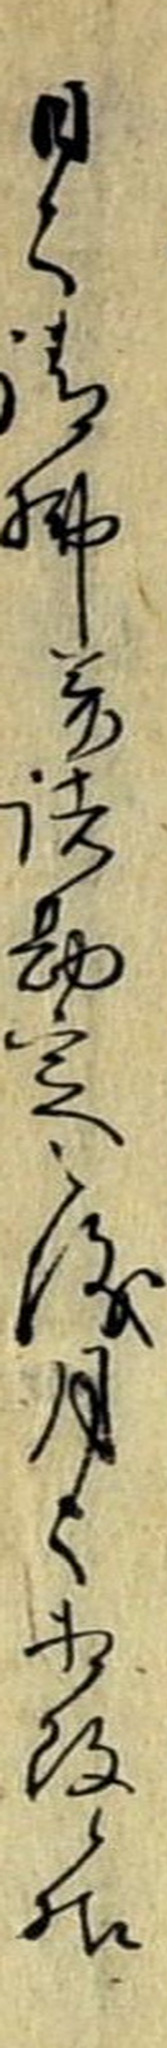日々請払并諸勘定之儀月々相改候様
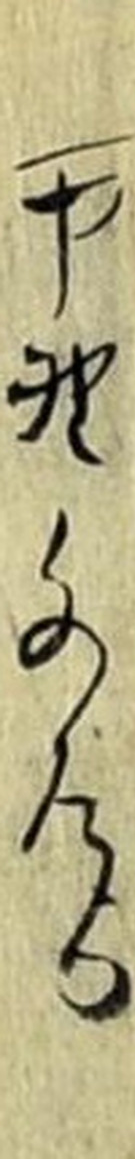中野文左衛門
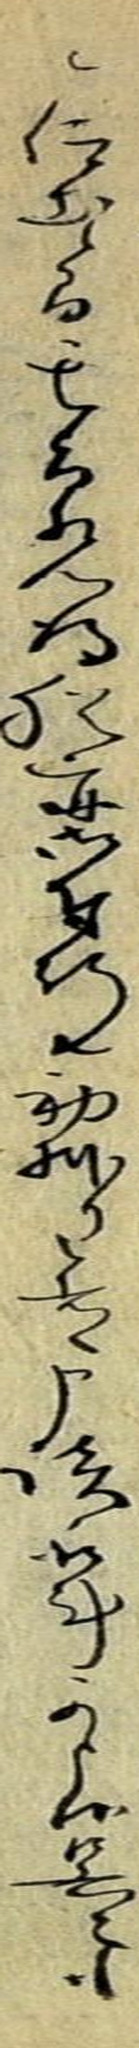被仰出候間其旨相心得猶亦御奉行共初掛り之者へ申談取計可申候呉々も
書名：命令之部 三
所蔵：福井県文書館 Fukui Prefectural Archives
